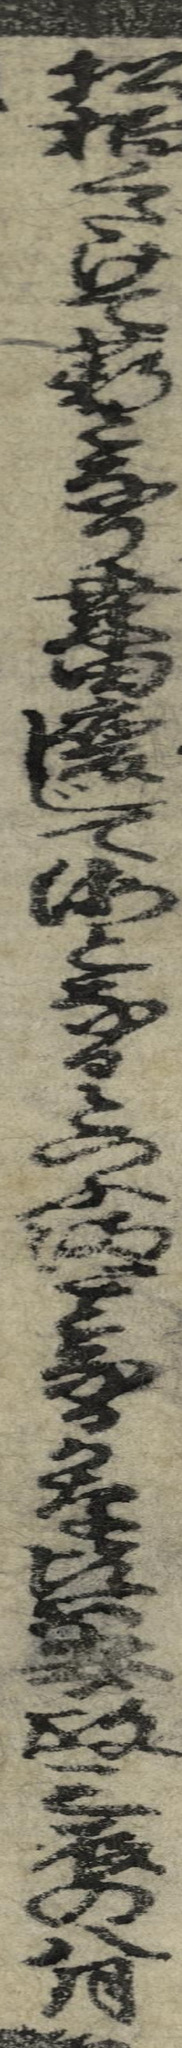松柏くだけて薪となり桑田変じて海となるといふまことなるかな比は安政三辰の八月
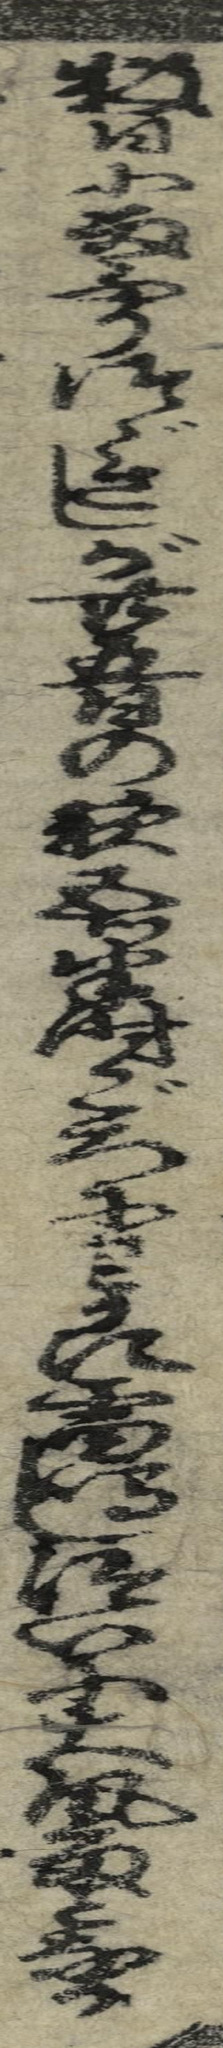数日小雨ふりつゞきしが廿五日の夜五ッ半時ころにわかに雷鳴しついに大風雨となり
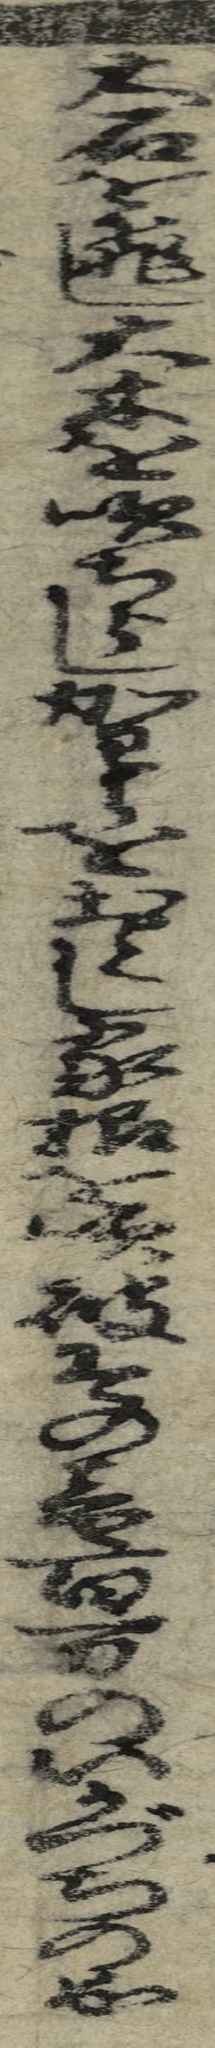大石を飛し大木をちらしかわらをおとし家根を吹破その音百万のいかづちの如
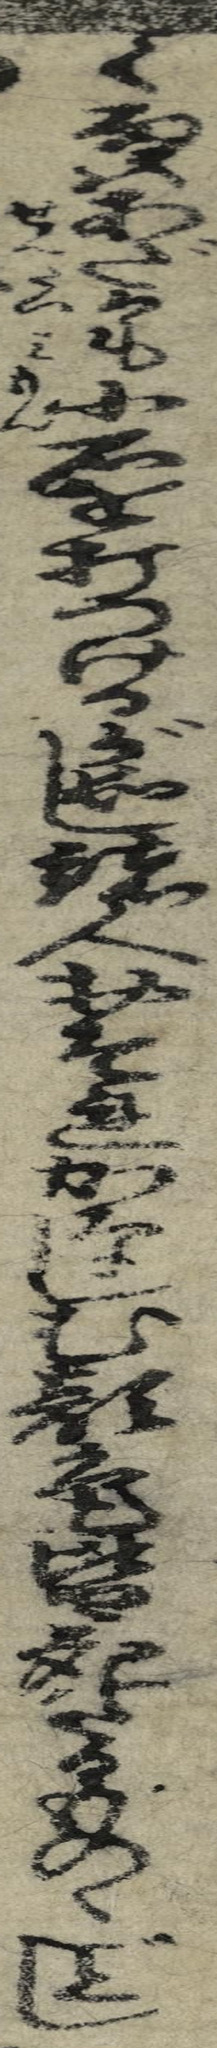く雨はあだかも小石を打つけるが如し諸人おそれかなしむ顔色皆死たるものゝごとし
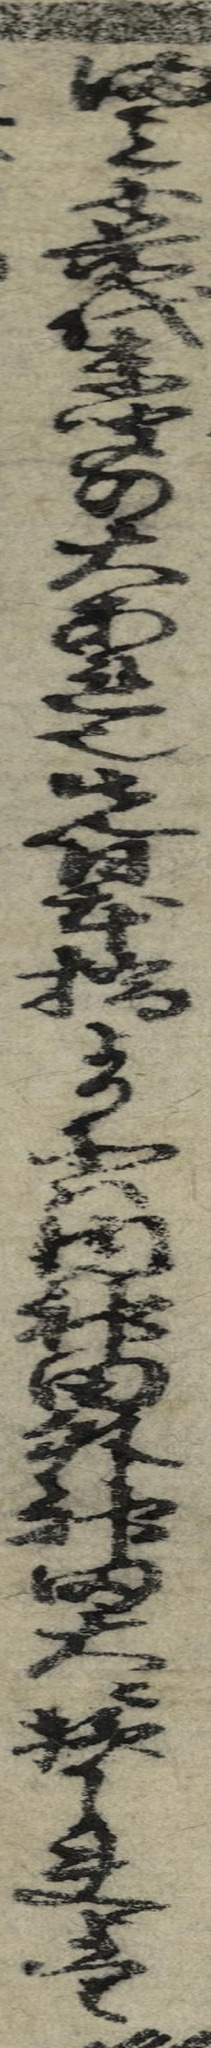まこと前代未聞の大あれ也先日本橋より北は内神田外神田大に損し夫より
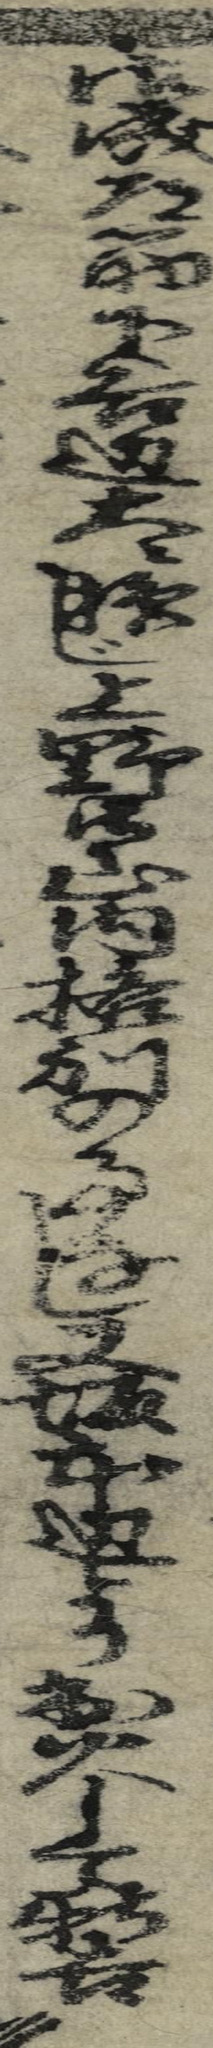御成道筋下谷辺大に損じ上野御山内各別の事なし又坂本辺より出火して新吉
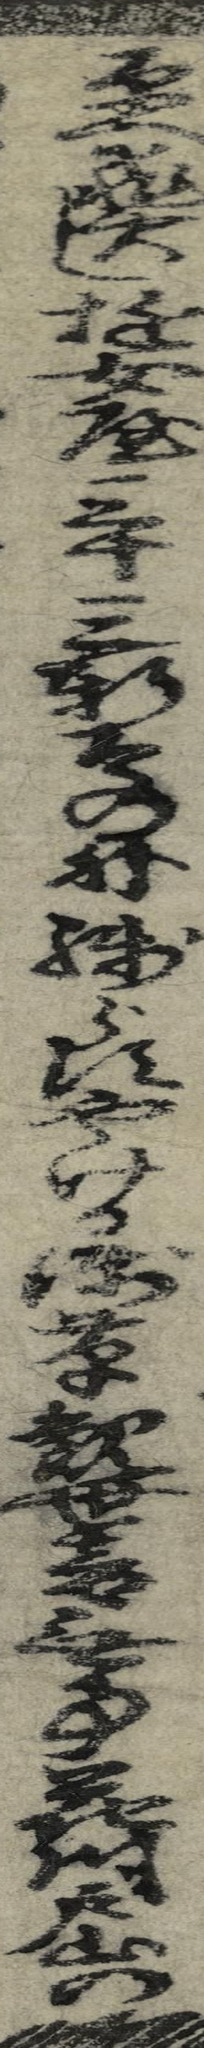原へ飛火し遊女屋三十三軒その外残らすやける浅草観世音無事花川戸山の
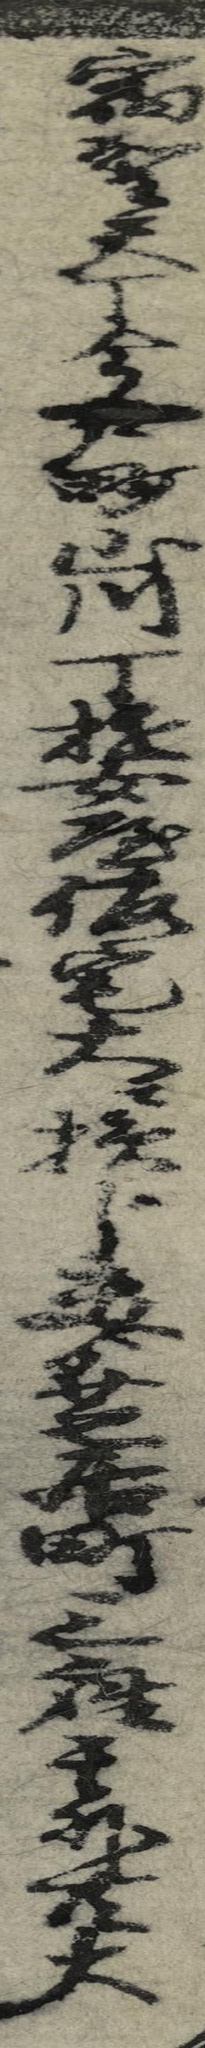宿聖天丁今戸町山川丁遊女屋仮宅大に損じ夫ゟ芝居町三座其外とも大
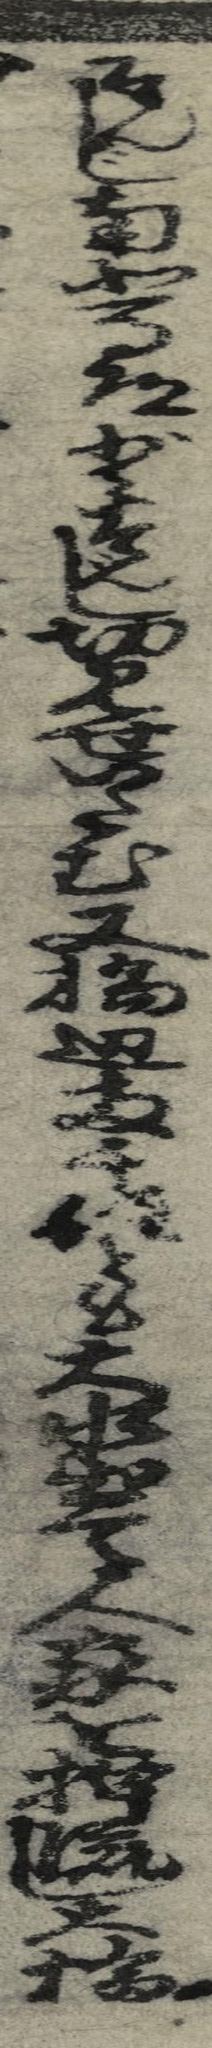そんじ南北馬道少々そんじ切見せいたむ又橋辺兩千住とも大水出て人家を押流し大橋
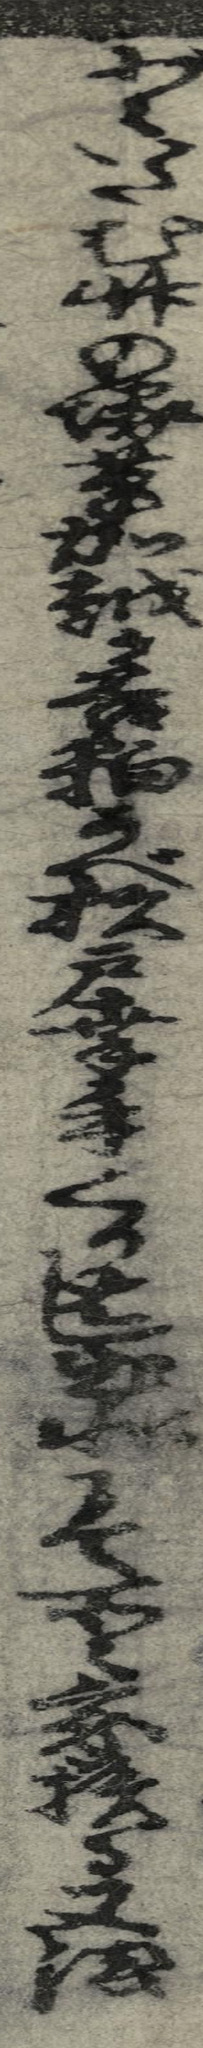少々いたむ竹の塚草加越ヶ谷粕かべ杉戸幸手くりはし出水にて所々家流る又浅
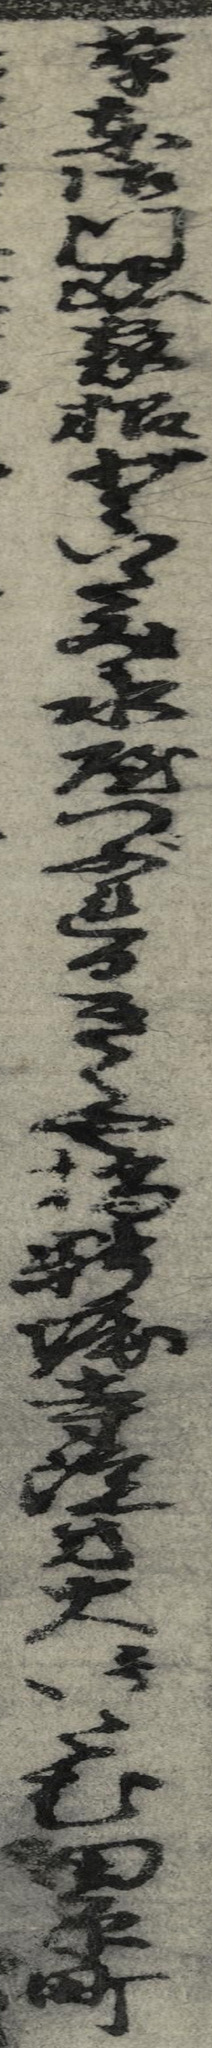草東御門跡家根少々いたみ水屋つぶれるきくや橋新堀寺院方大にいたむ田原町
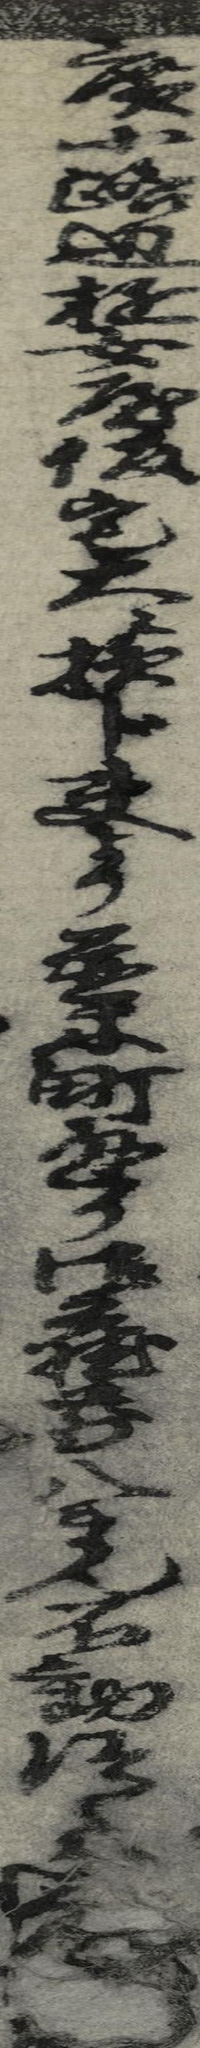広小路辺遊女屋仮宅大に損じ夫より吉原町通り御蔵前八まん石動つゝがなし御厩
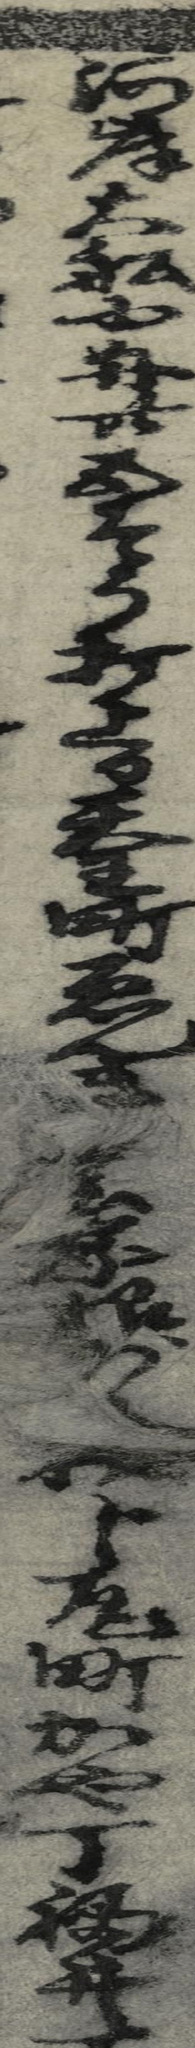河岸大船小舟共五そう打上る天王ゑんま堂家根少々損じ瓦町かや丁福井丁
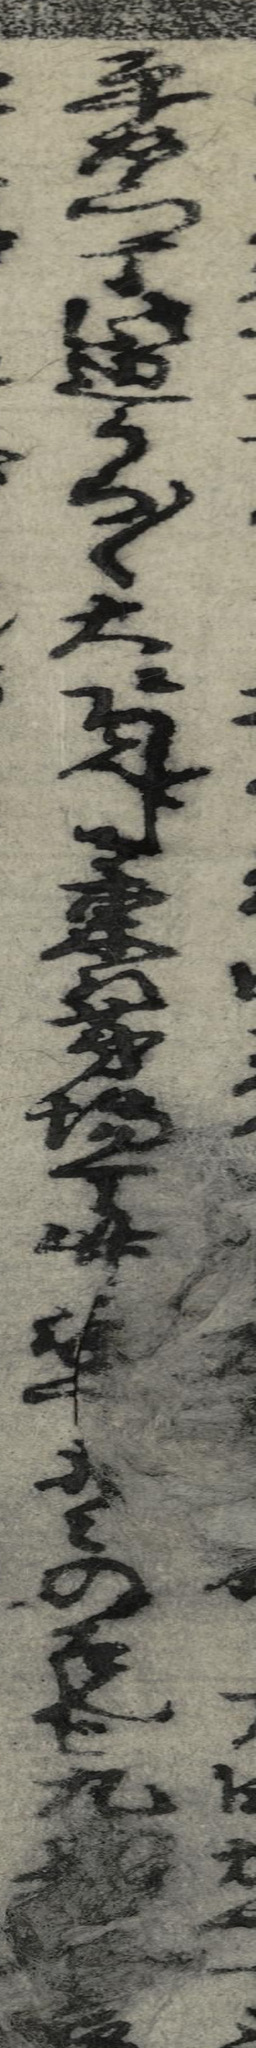平右衛門丁此辺うら〳〵大にそんじる東は茅場丁竹嶋丁少々の損じ九鬼様表御門長
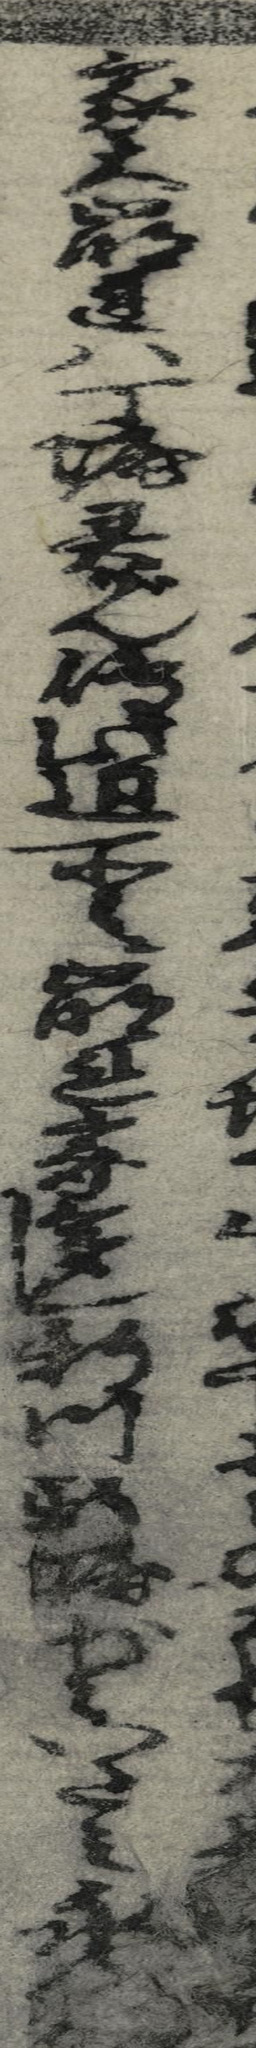家大崩れ八丁堀霊がん嶋此辺所々崩れ家多し新川新堀少々いたみ永代橋大
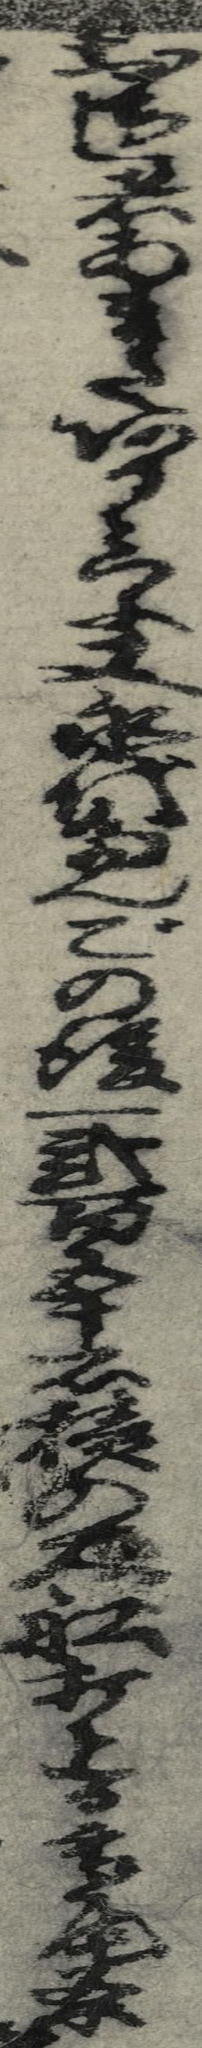おちし者あまたありといふ又永代だんごの後一弐百五十石積の大船打上る高尾茶
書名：安政三辰八月廿五日　大風雨出水損場所之圖
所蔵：東京大学地震研究所図書室 Earthquake Research Institute Library, The University of Tokyo, JAPAN
